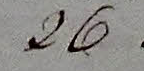26
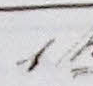1
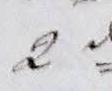2
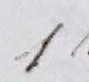1
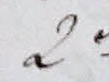2
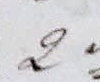2
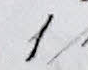1
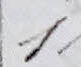1
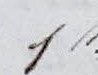1
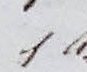1
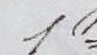1
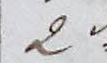2
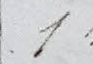1
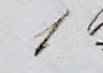1
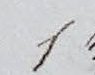1
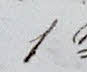1
